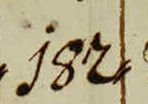182
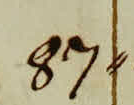87
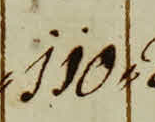110
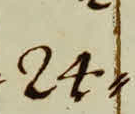24
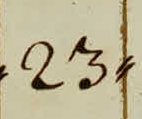23
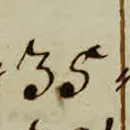35
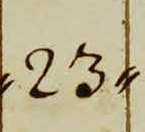23
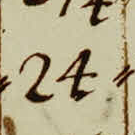24
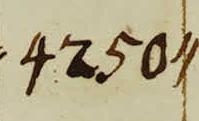4250
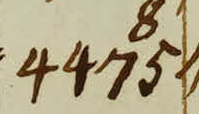4475
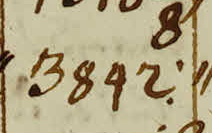3842.
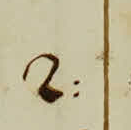2:
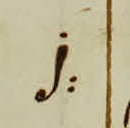1:
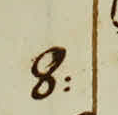8:
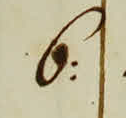6:
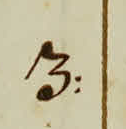3:
